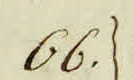66.
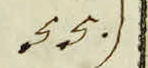55.
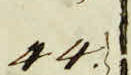44.
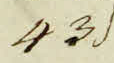43
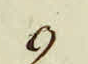9
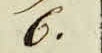6.
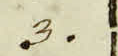3.
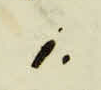1.
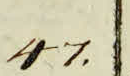47.
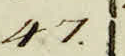47.
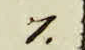7.
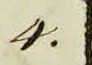4.
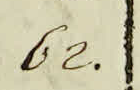62.
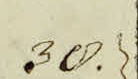38.
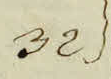32
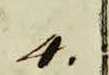4.
